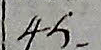45
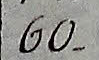60
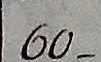60
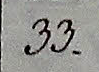33
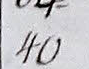40
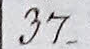37
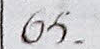65
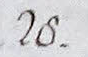28
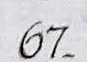67
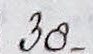38
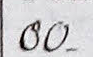80
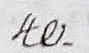40
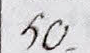50
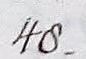48
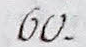60
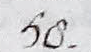58
